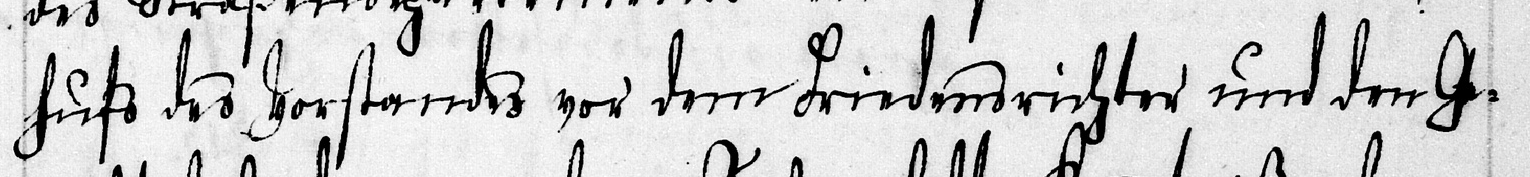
hufs des Vorstandes vor dem Friedensrichter und den Ge¬
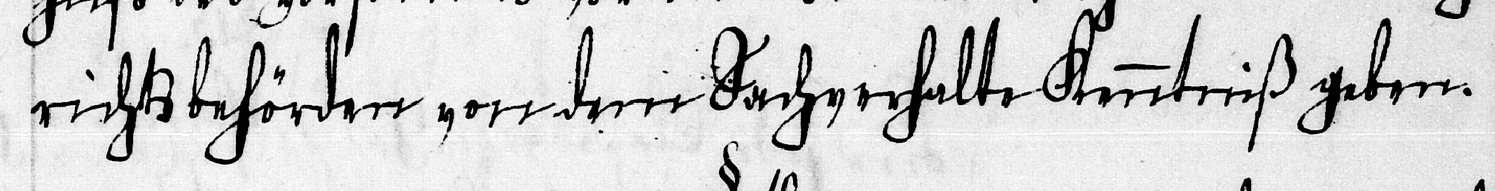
richtsbehörden von dem Sachverhalte Kenntniß geben.
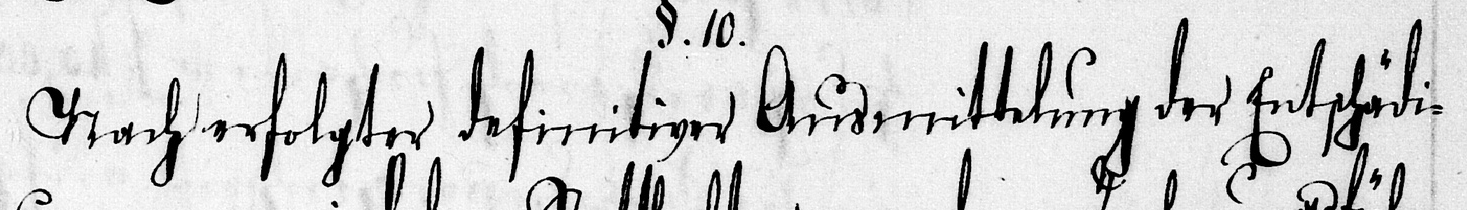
Nach erfolgter definitiver Ausmittelung der Entschädi¬
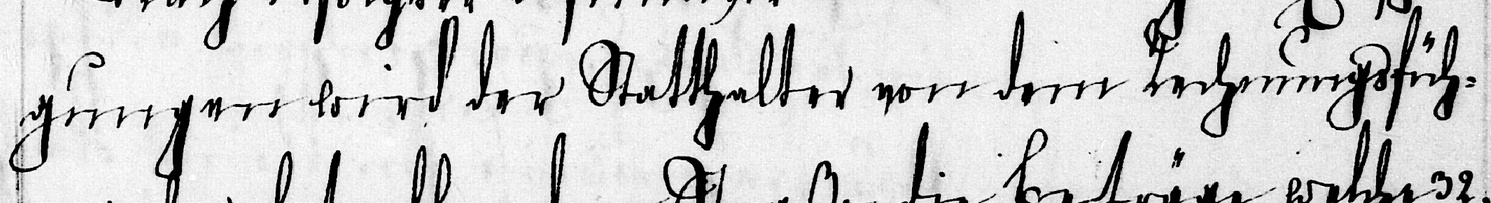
gungen wird der Statthalter von dem Rechnungsfüh¬
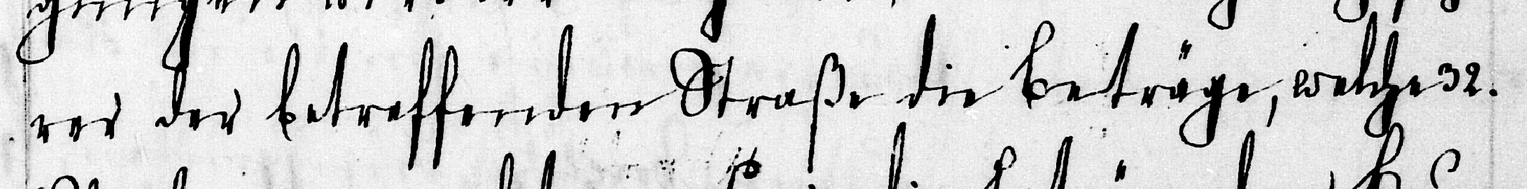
rer der betreffenden Straße die Beträge, welche 32.
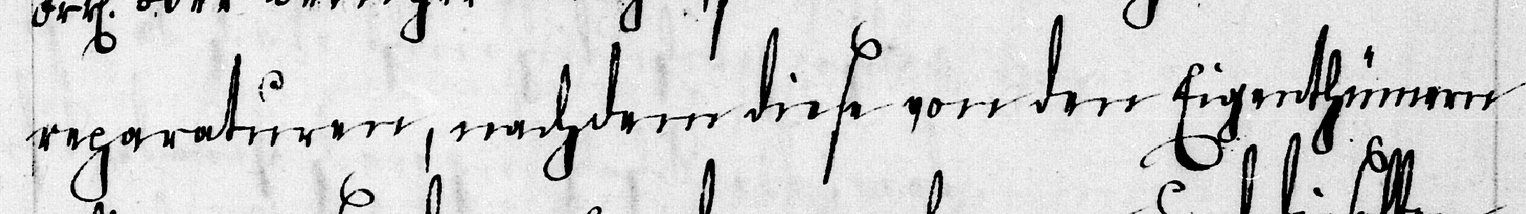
reparaturen, nachdem diese von den Eigenthümern
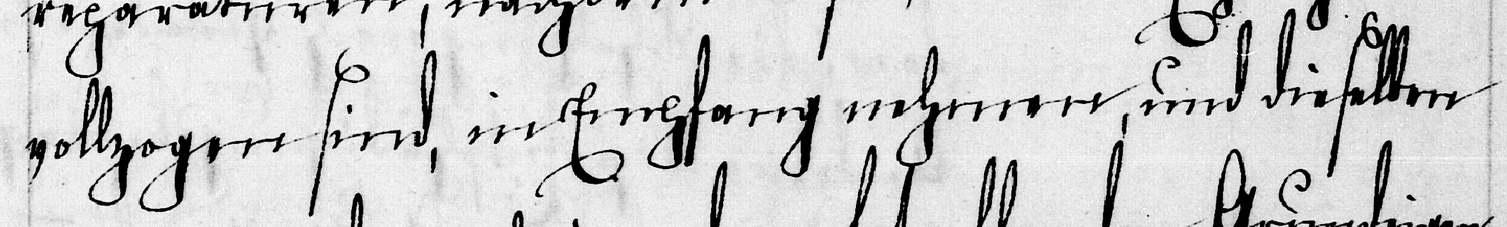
vollzogen sind, in Empfang nehmen, und dieselben
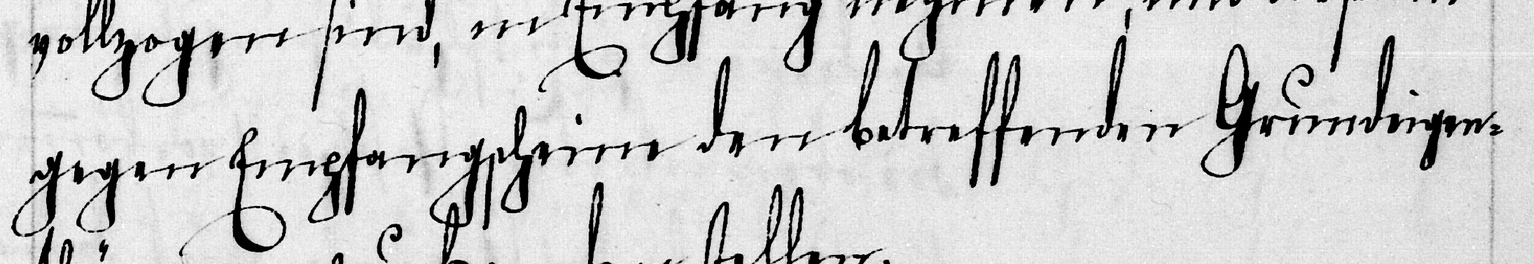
gegen Empfangscheine den betreffenden Grundeigen¬
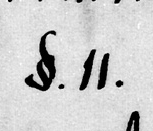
§. 11.
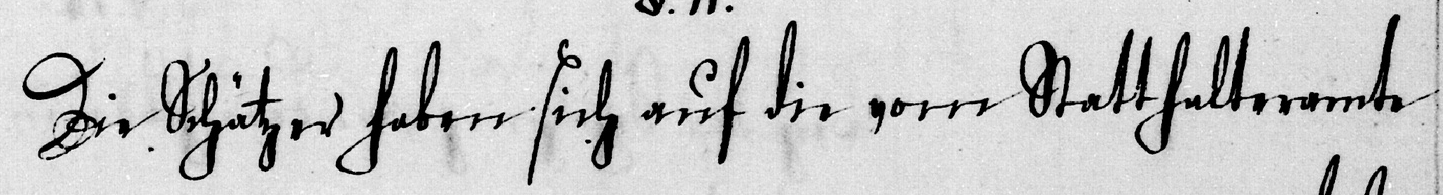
Die Schätzer haben sich auf die vom Statthalteramte
